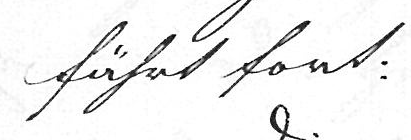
fährt fort:
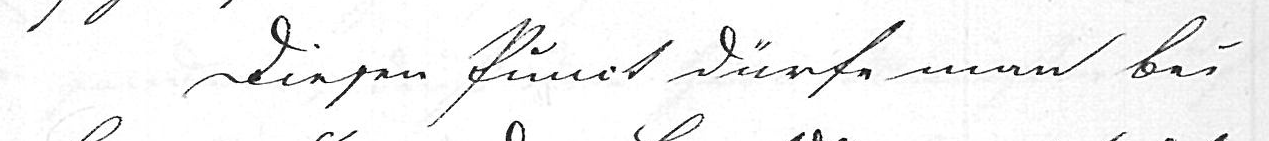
Diesen Punct dürfe man bei
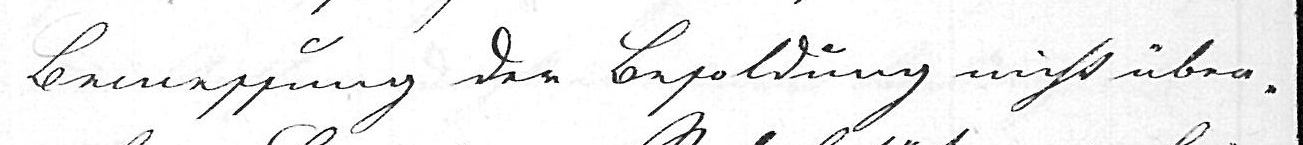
Bemessung der Besoldung nicht über-
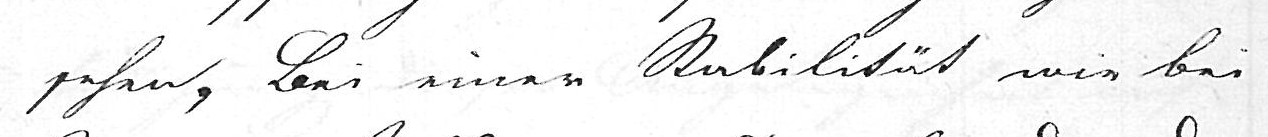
sehen. Bei einer Stabilität wie bei
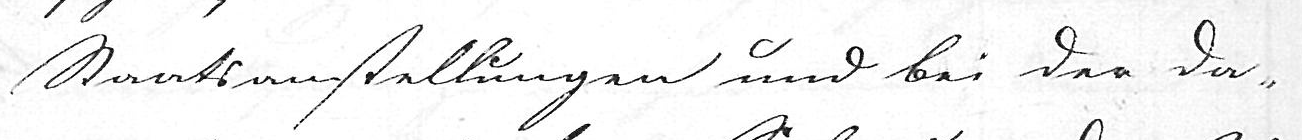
Staatsanstellungen und bei der da-
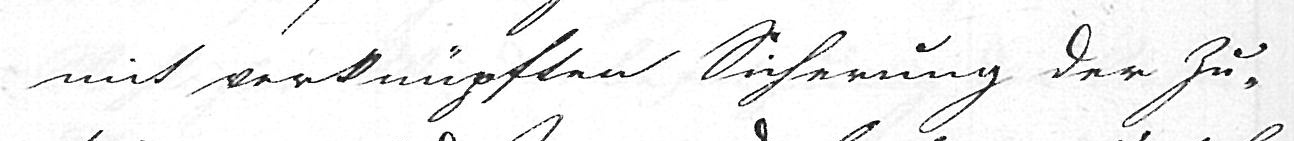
mit verknüpften Sicherung der Zu-
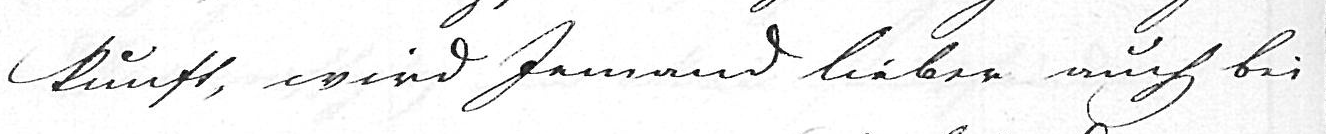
kunft, wird Jemand lieber auch bei
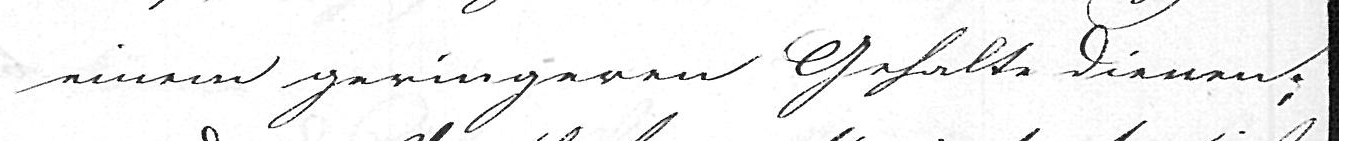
einem geringeren Gehalte dienen;
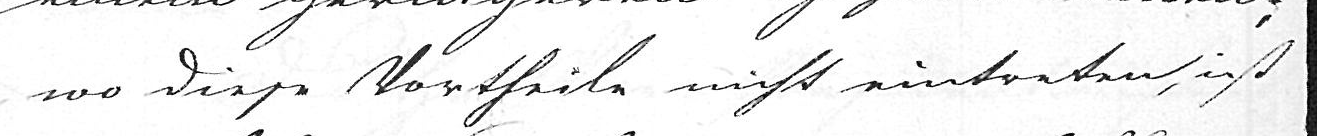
wo diese Vortheile nicht eintreten, ist
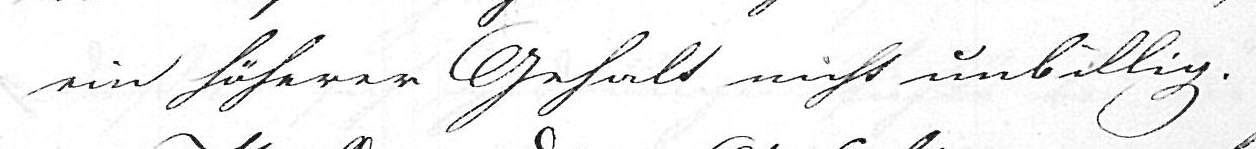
ein höherer Gehalt nicht unbillig.
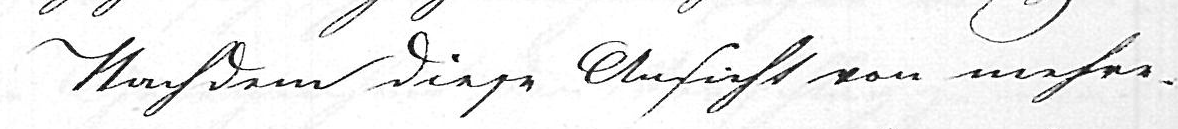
Nachdem diese Ansicht von mehre-
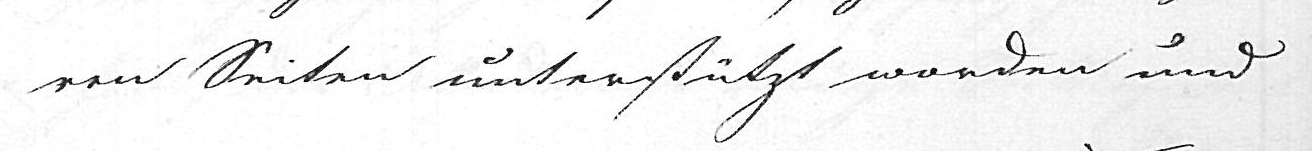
ren Seiten unterstützt worden und
